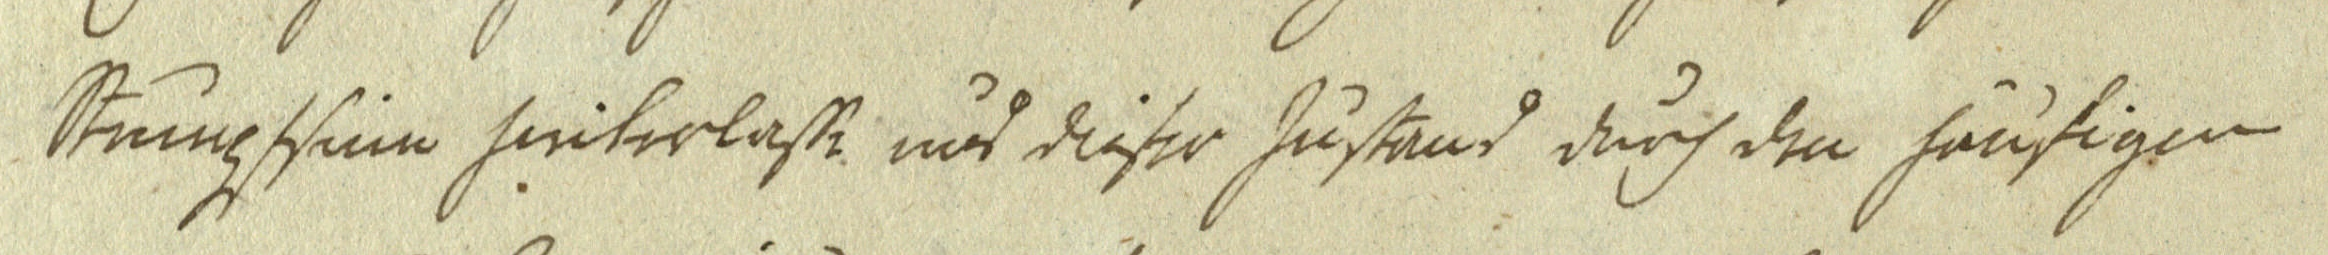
Stumpfsinn hinterlasse und dieser Zustand durch den häufigen
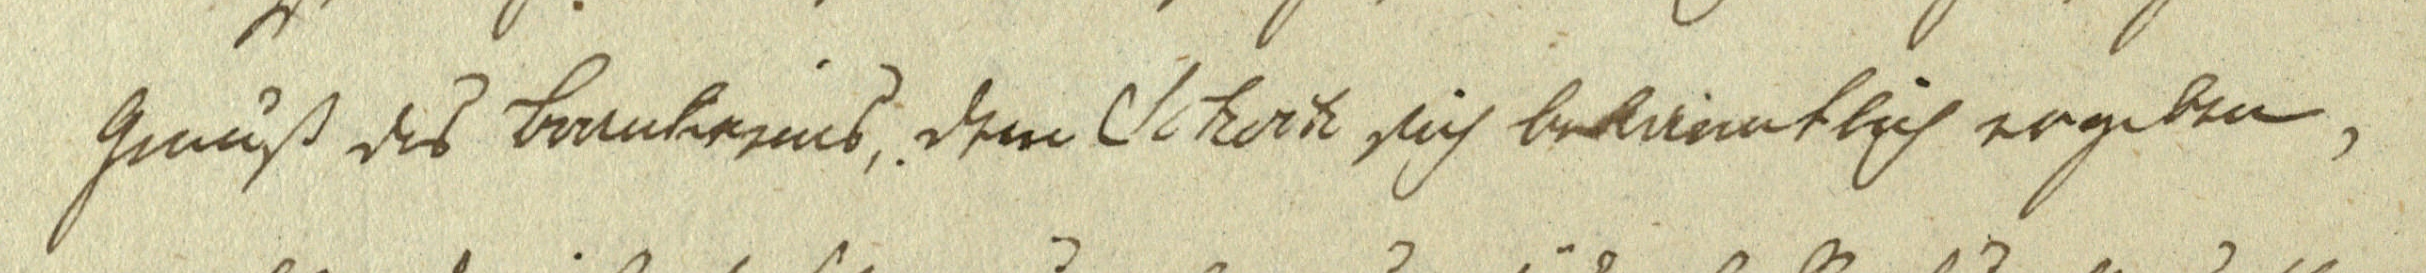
Genuß des Brantweins, dem Schoch sich bekanntlich ergeben,
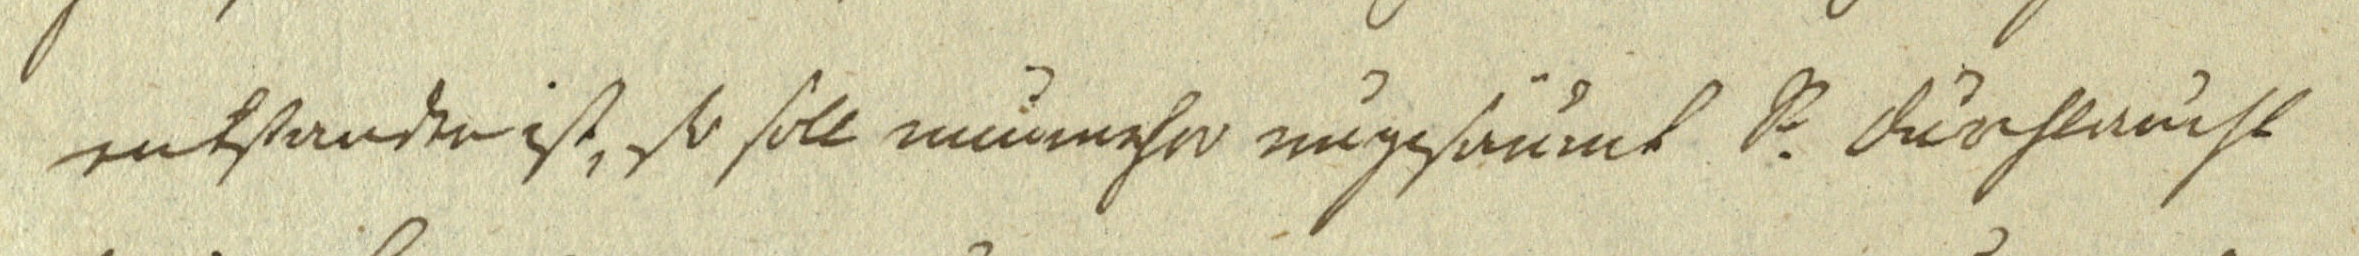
entstanden ist, so soll nunmehro ungesäumt Sr. Durchlaucht
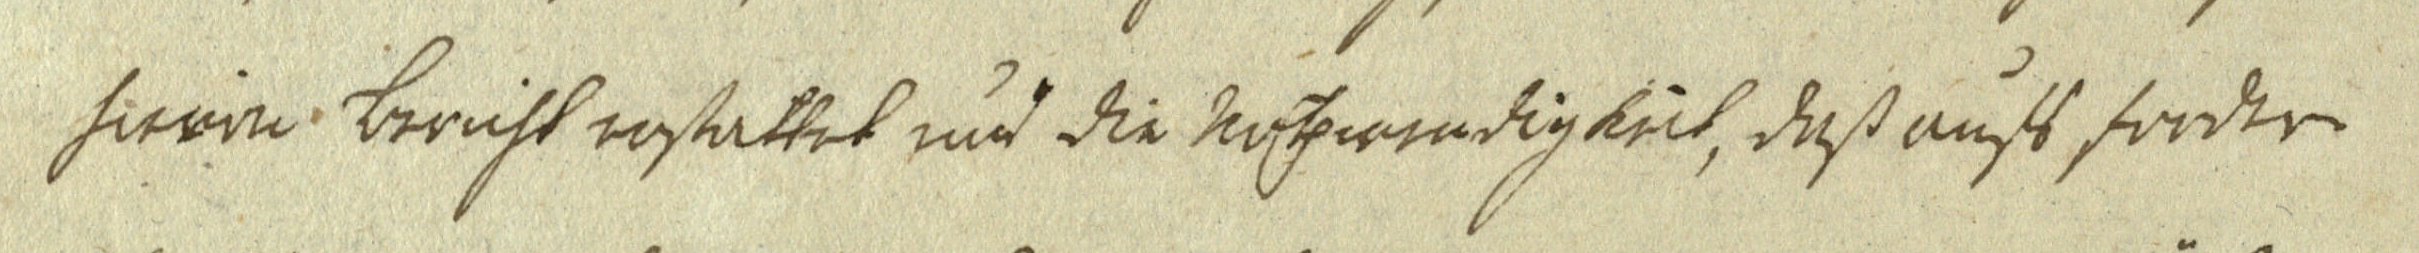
hierin Bericht erstattet und die Nothwendigkeit, daß aufs forder¬
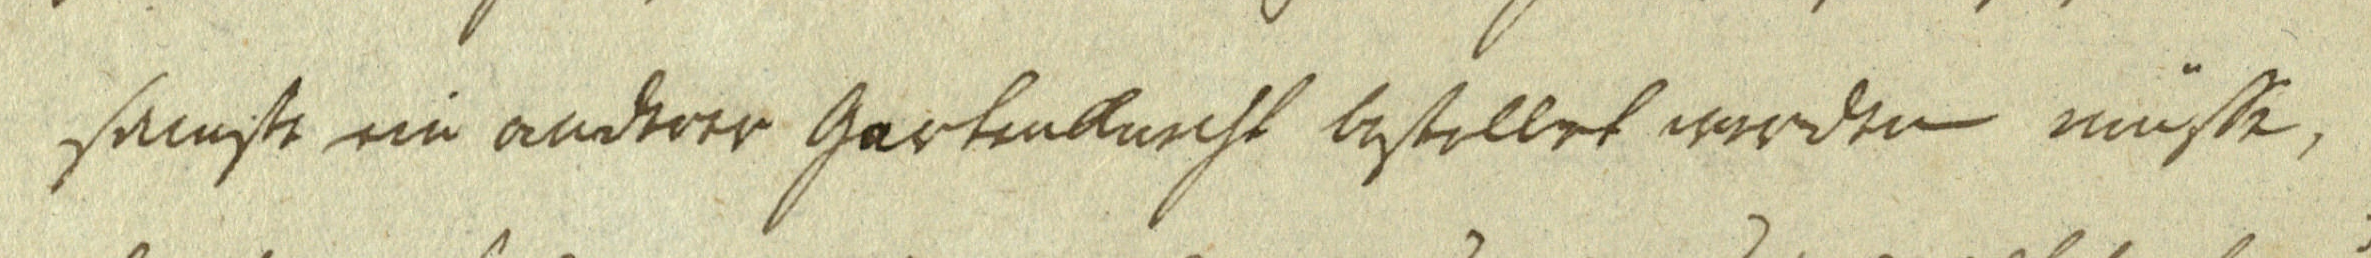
samste von anderer Gartenknecht bestellet werden müsse,
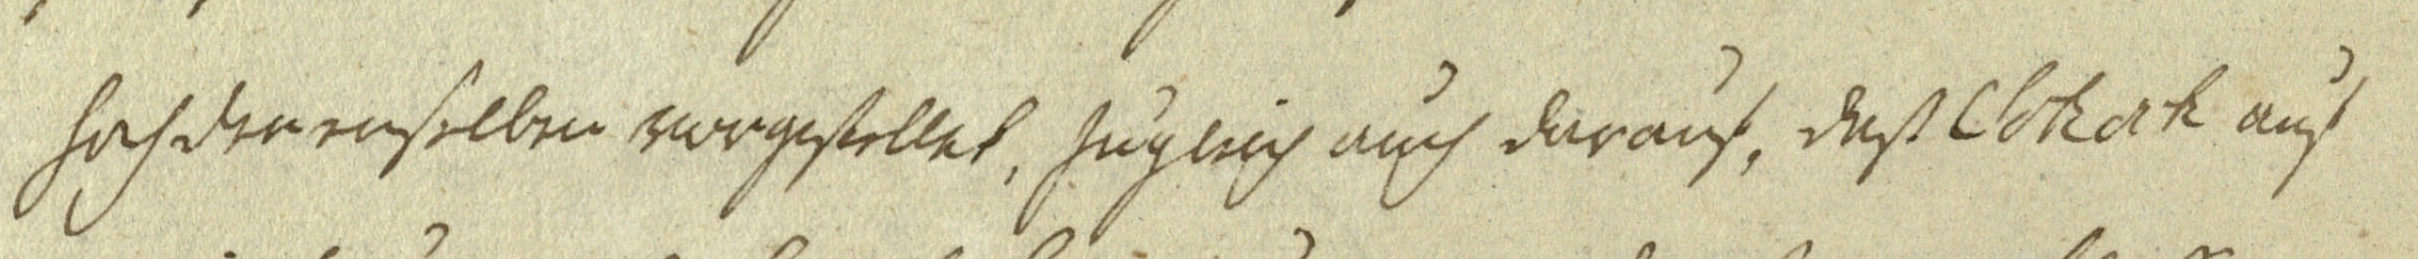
hochdenenselben vorgestellet, zugleich auch darauf, daß Schoch auf
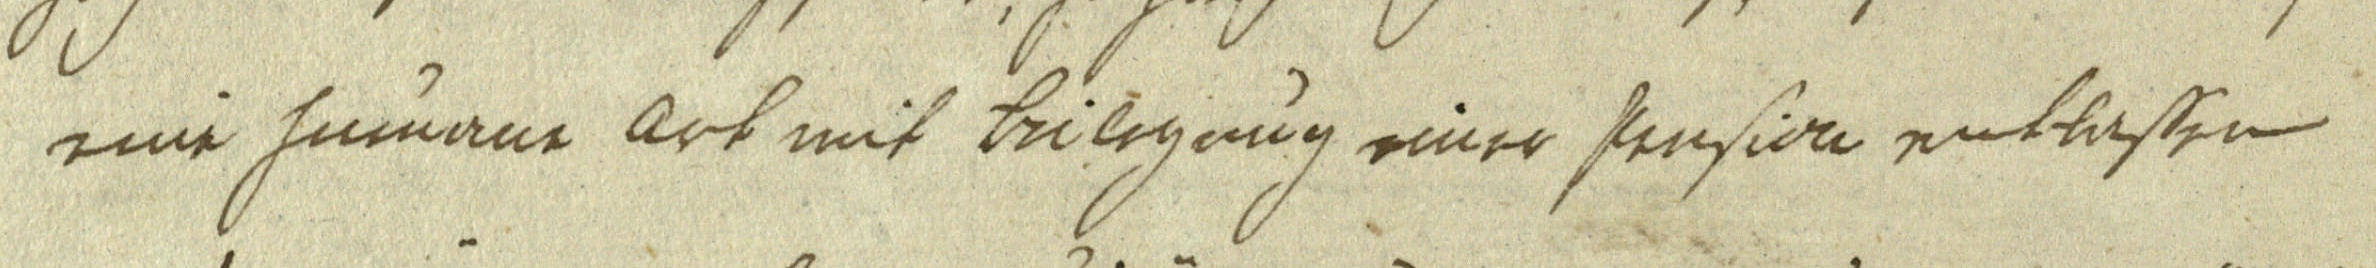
eine humane Art mit Beilegung einer Pension entlassen
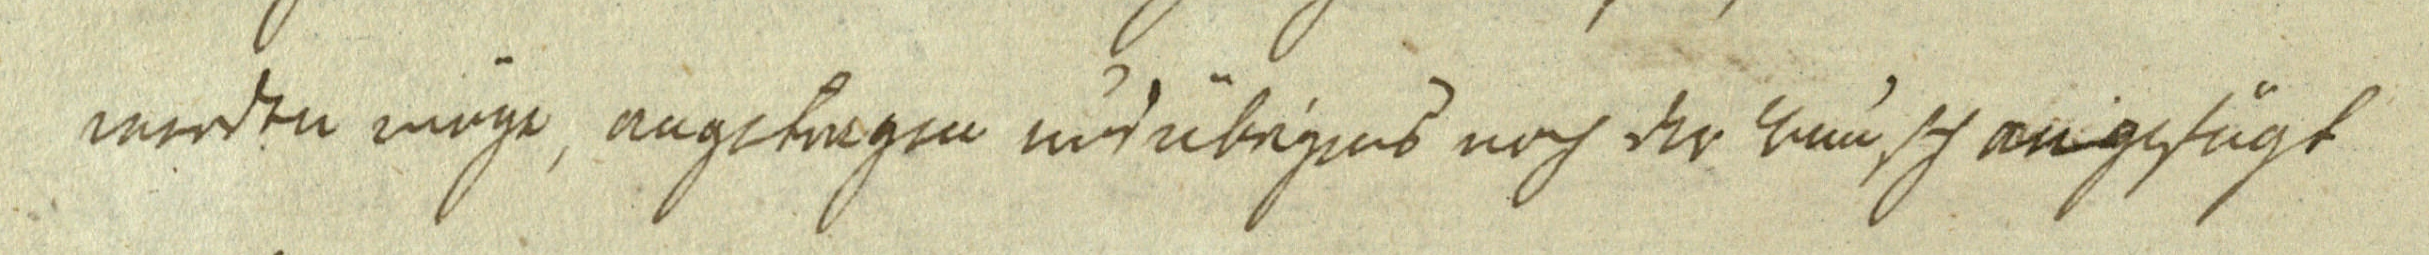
werden möge, angetragen und übrigens noch der Wunsch angefügt
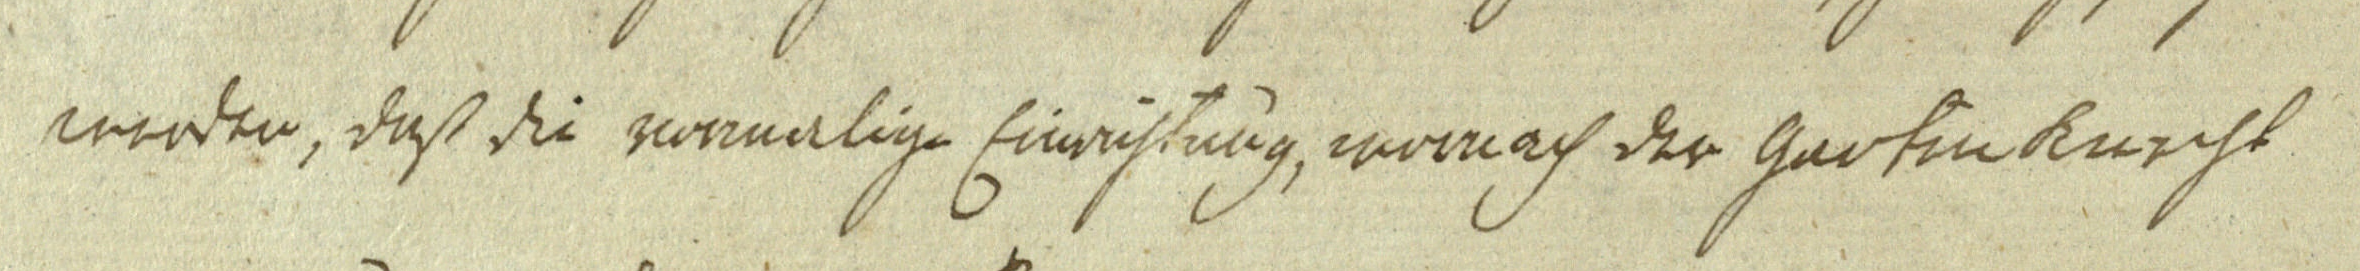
werden, daß die vormalige Einrichtung, wornach der Gartenknecht
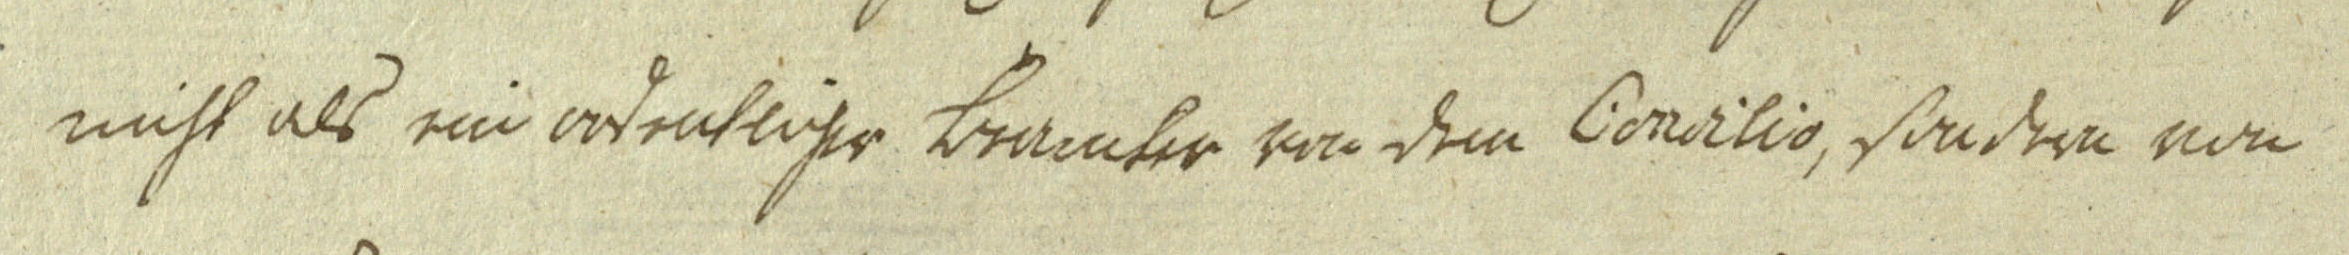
nicht als ein ordentlicher Beamter von dem Concilio, sondern von
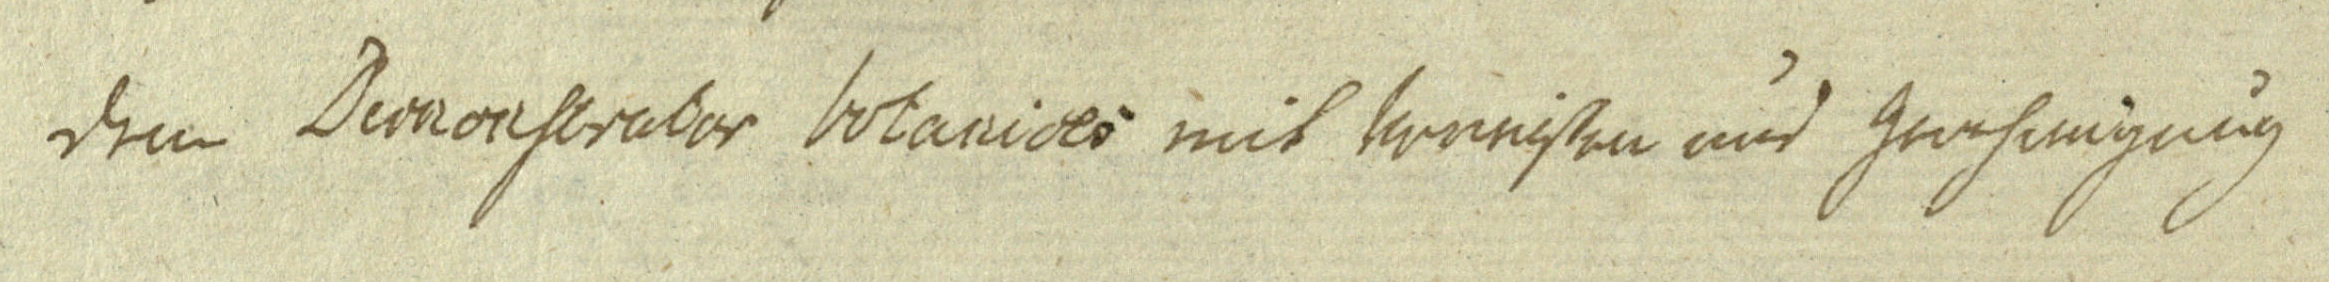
dem Demonstrator botanices mit Vorwissen und Genehmigung
